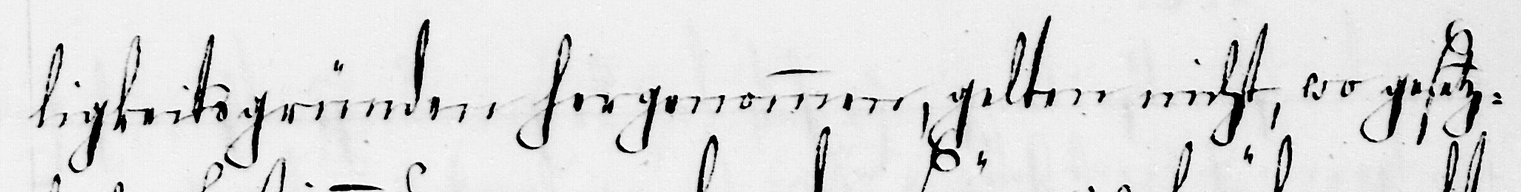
ligkeitsgründen hergenommen, gelten nicht, wo gesetz¬
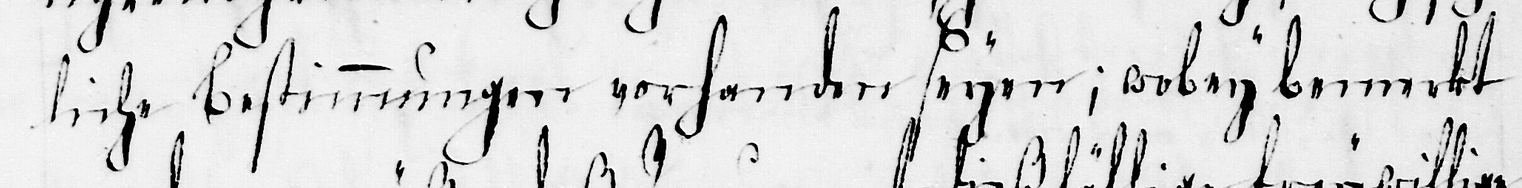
liche Bestimmungen vorhanden seyen; wobey bemerkt
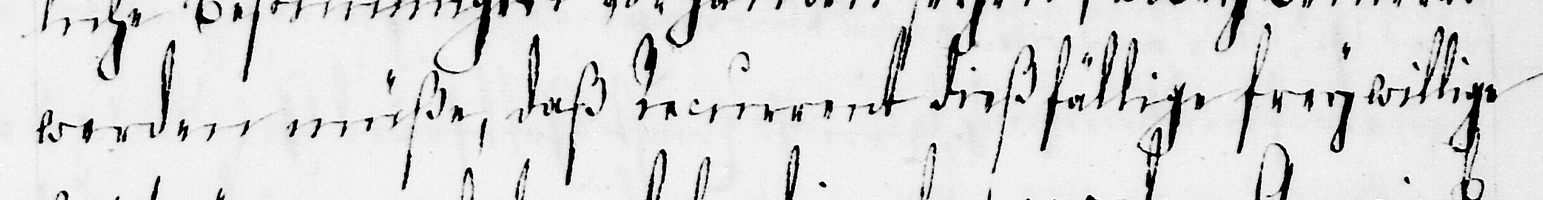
werden müße, daß Recurrent dießfällige freywillige
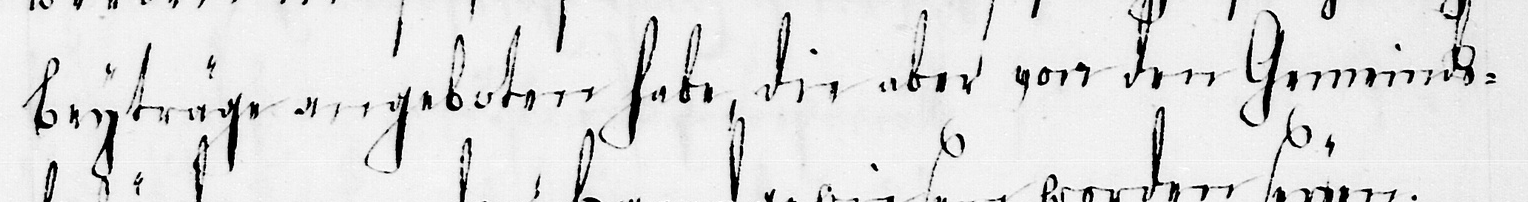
Beyträge angeboten habe, die aber von den Gemeinds¬
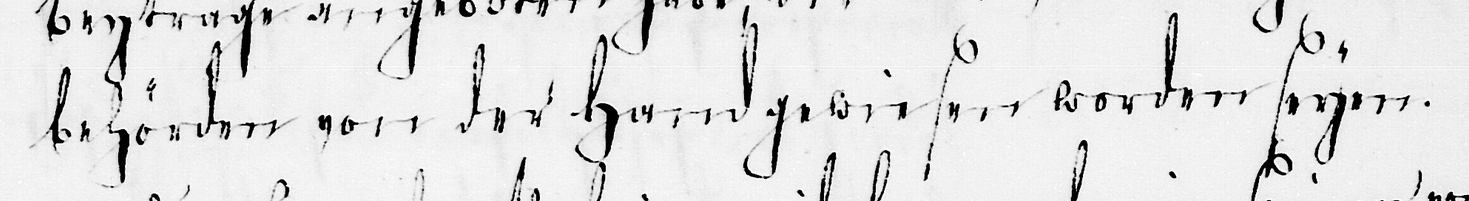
behörden von der Hand gewiesen worden seyen.
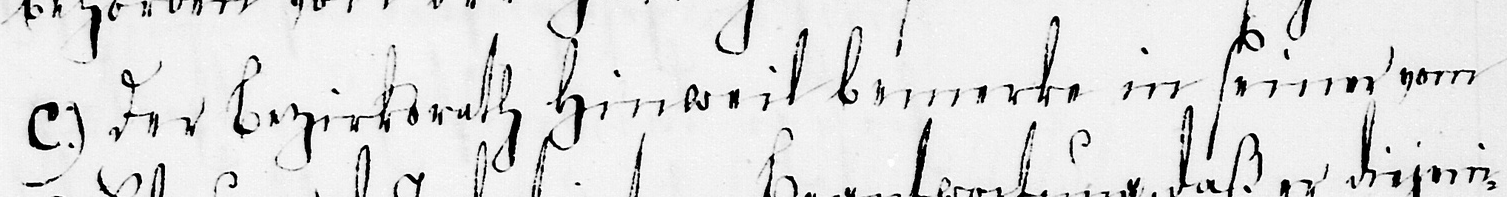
C.) Der Bezirksrath Hinweil bemerke in seiner vom
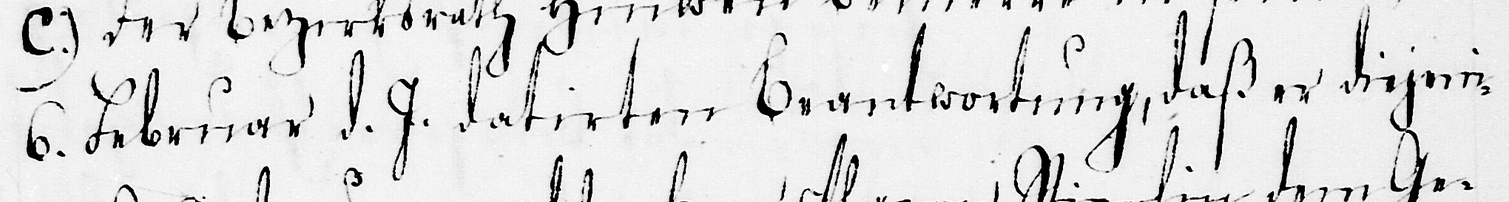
6. Februar d. J. datirten Beantwortung, daß er diejeni¬
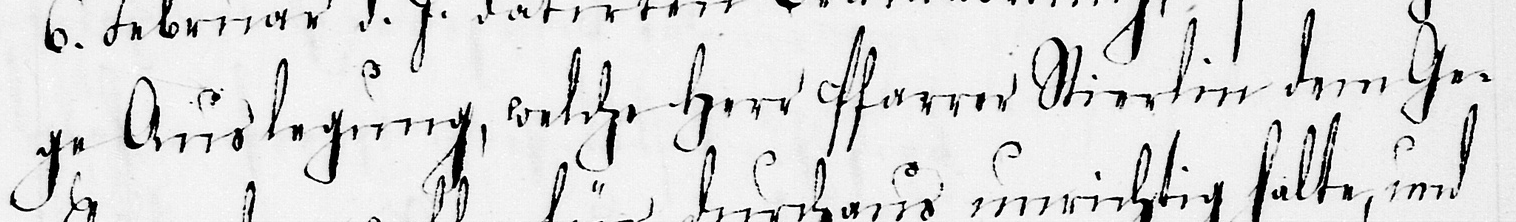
ge Auslegung, welche Herr Pfarrer Stierlin dem Ge¬
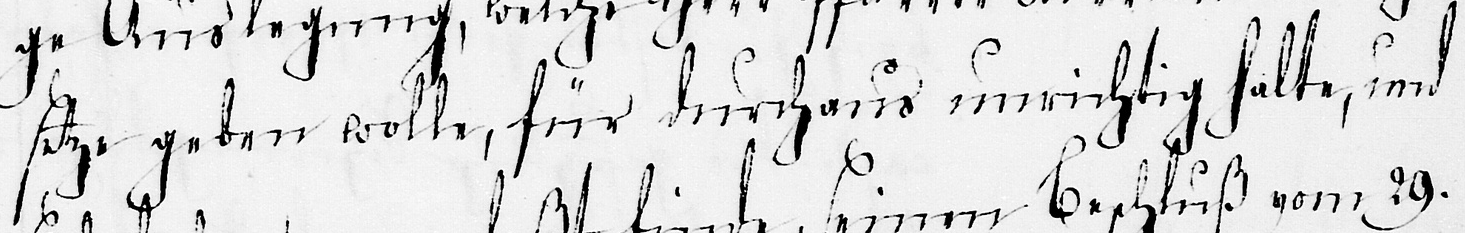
setze geben wolle, für durchaus unrichtig halte, und
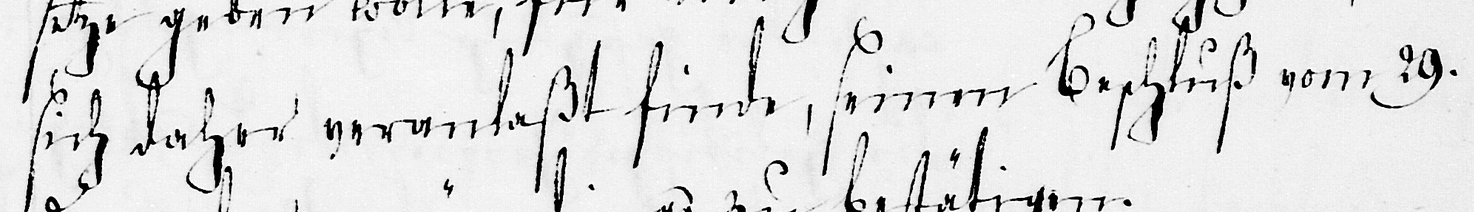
sich daher veranlaßt finde, seinen Beschluß vom 29.
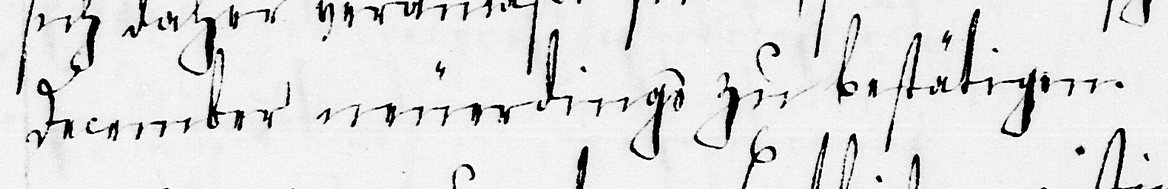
December neuerdings zu bestätigen.
